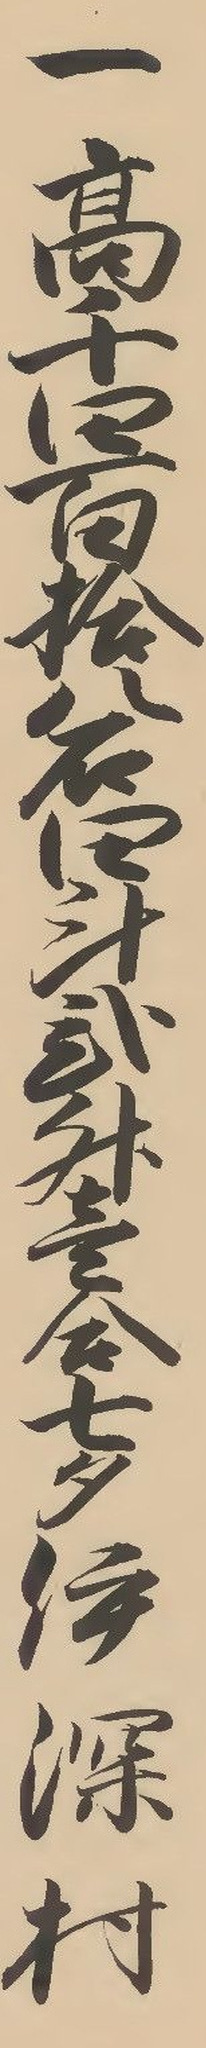一高千四百拾八石四斗弐升壱合七勺伊深村
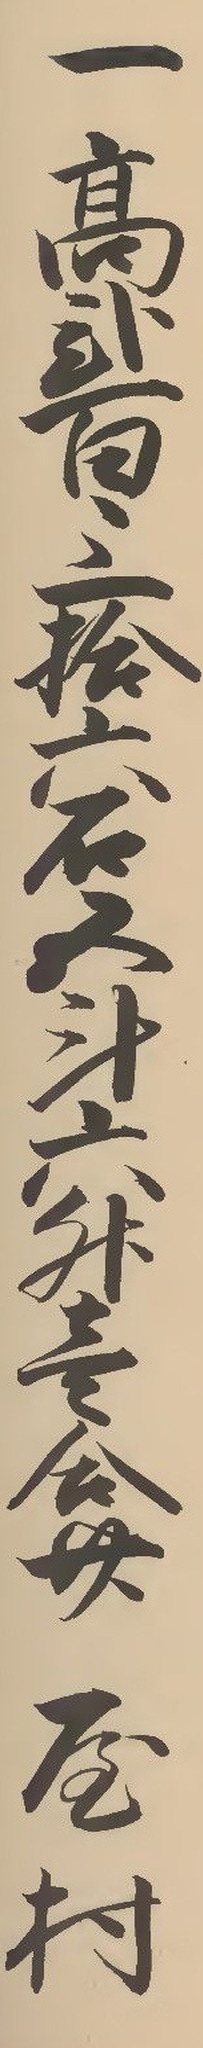一高弐百三拾六石五斗六升壱合廿屋村
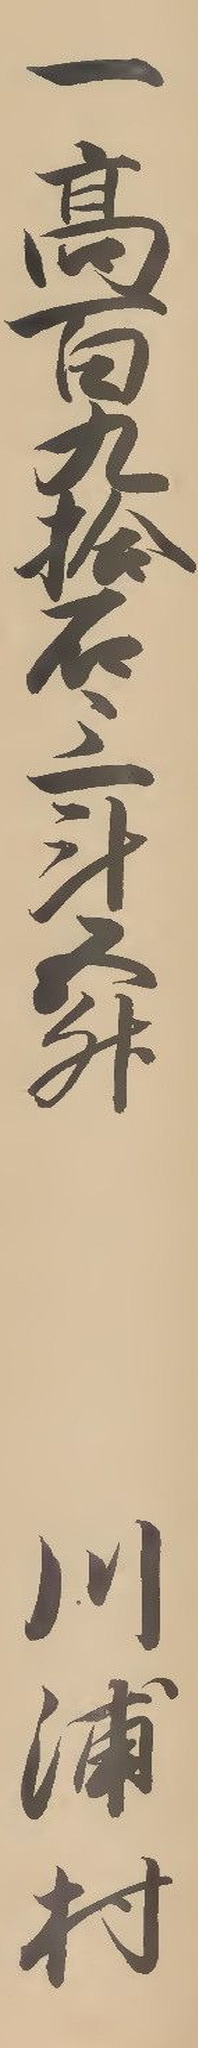一高百九拾石三斗五升川浦村
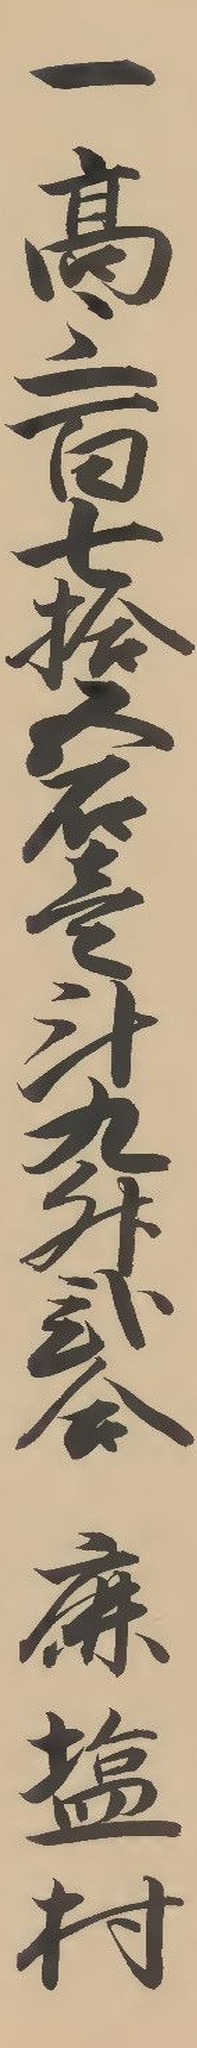一高三百七拾五石壱斗九升弐合鹿塩村

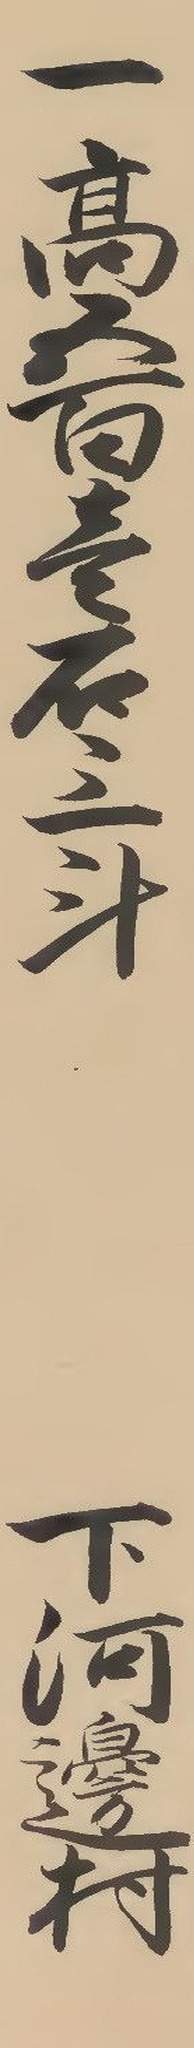一高五百壱石三斗下河辺村

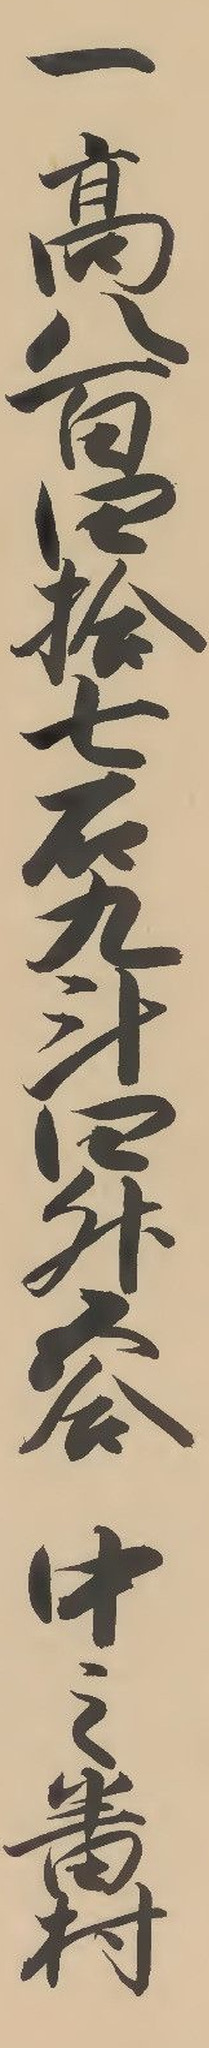一高八百四拾七石九斗四升五合中之番村
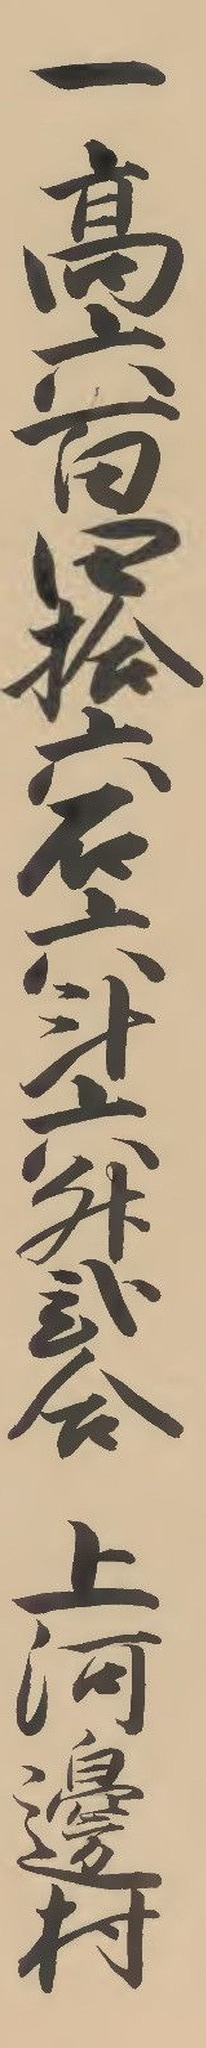一高六百四拾六石六斗六升弐合上河辺村
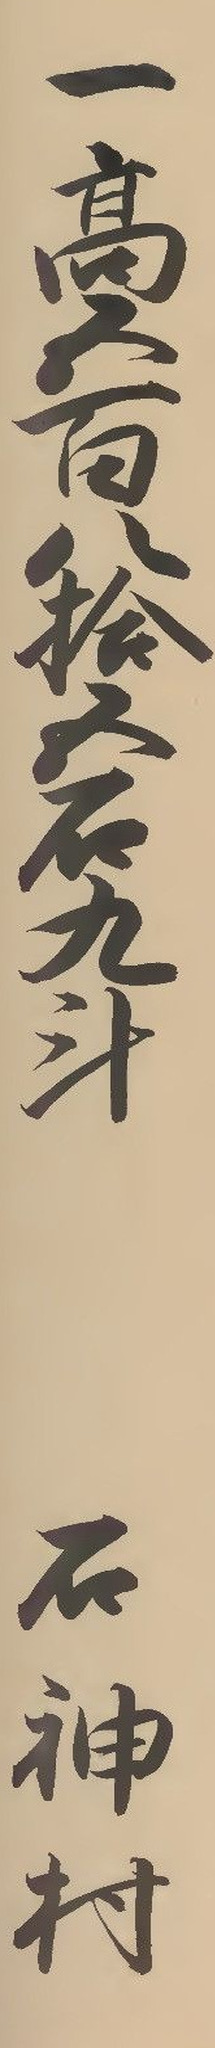一高五百八拾五石九斗石神村
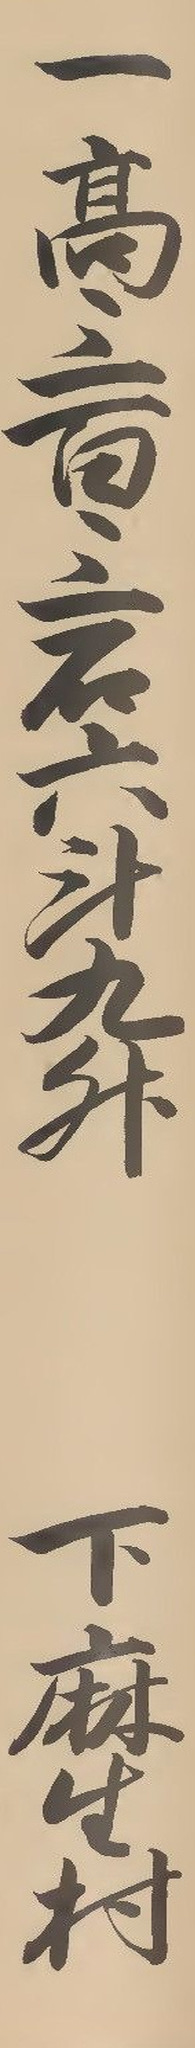一高三百三石六斗九升下麻生村

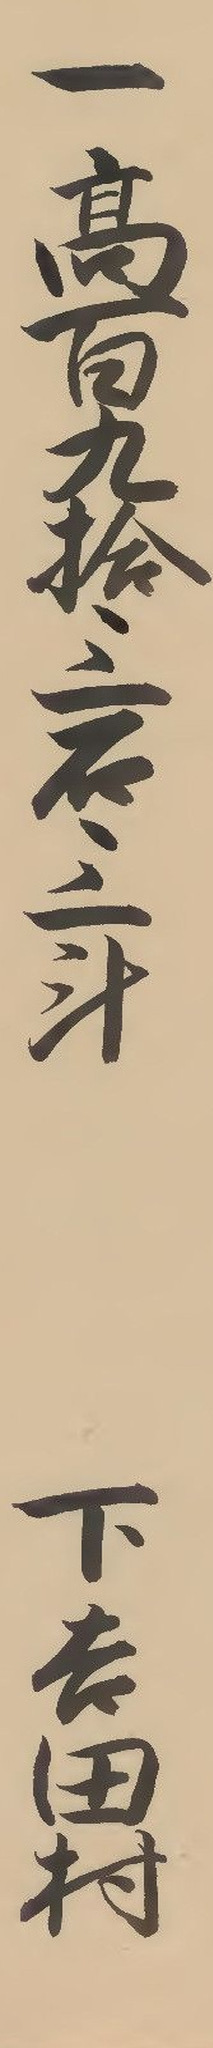一高百九拾三石三斗下吉田村
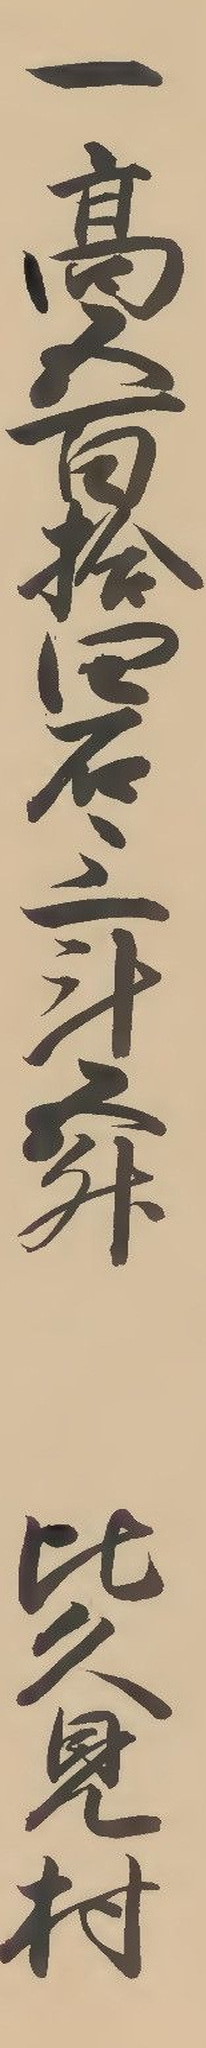一高五百拾四石三斗五升比久見村
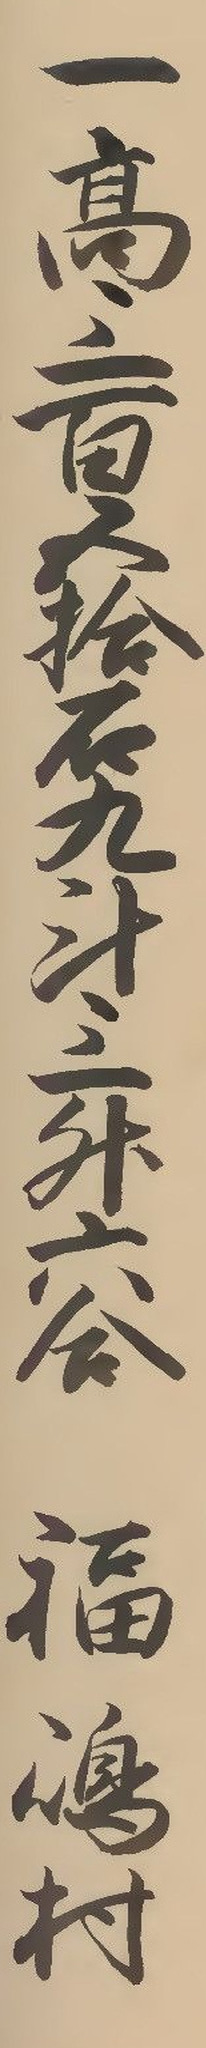一高三百五拾石九斗三升六合福島村
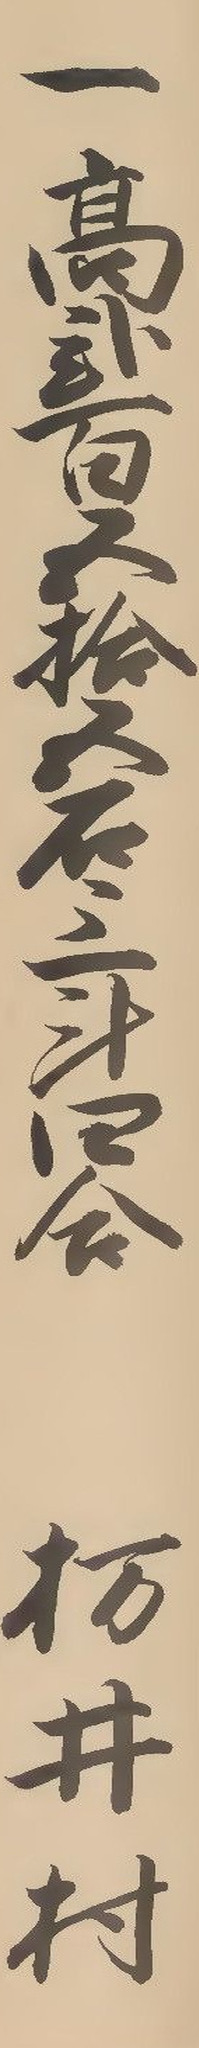一高弐百五拾五石三斗四合栃井村
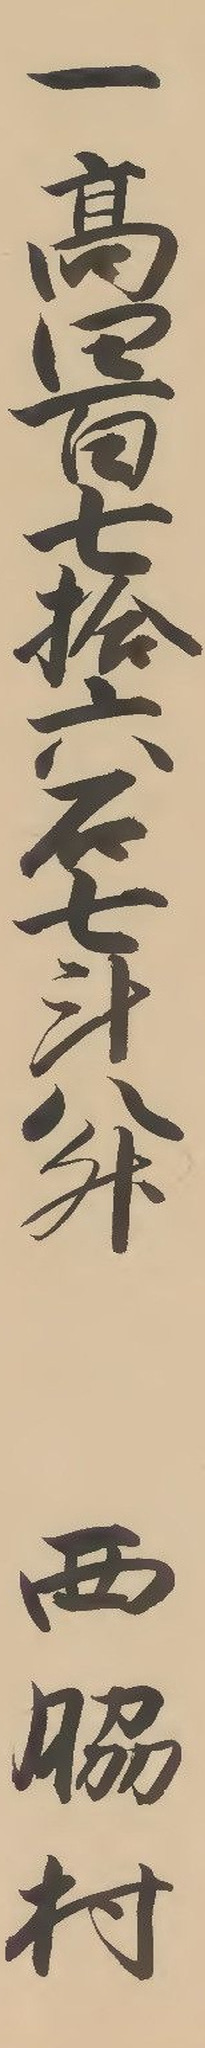一高四百七拾六石七斗八升西脇村
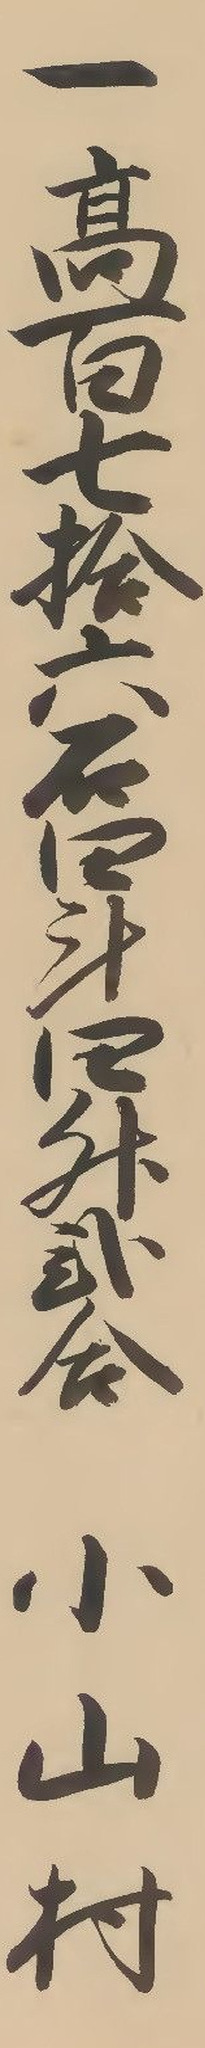一高百七拾六石四斗四升弐合小山村
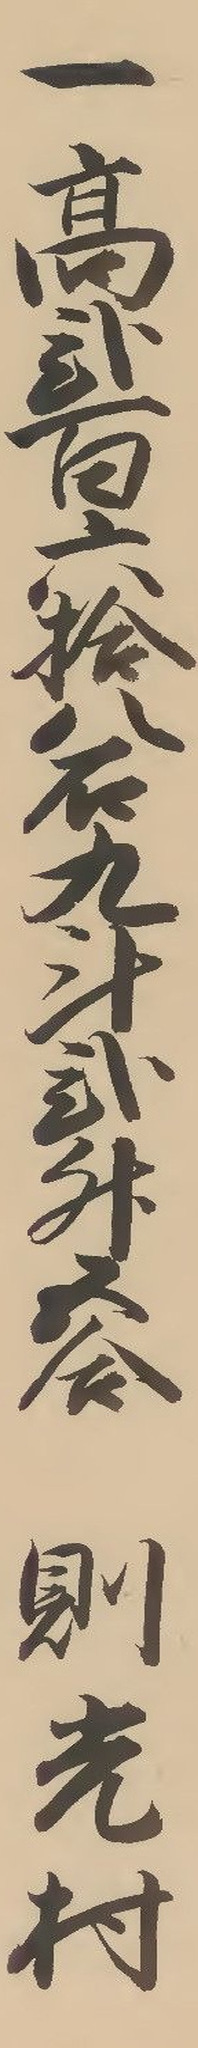一高弐百六拾八石九斗弐升五合則光村
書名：美濃国郷帳
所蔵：国立公文書館 National Archives of Japan
